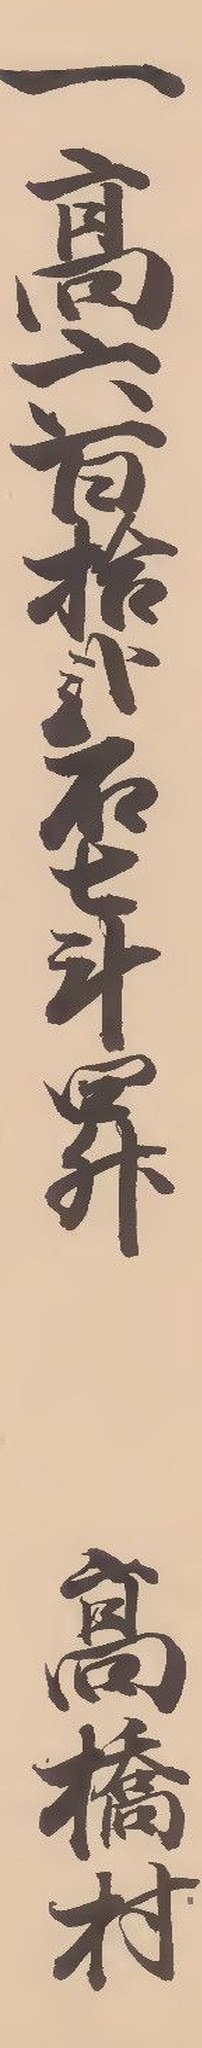一高六百拾弐石七斗四升高橋村
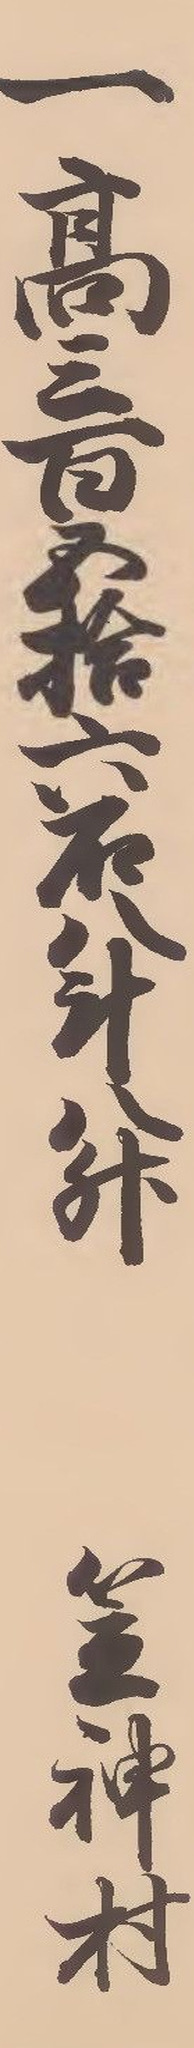一高三百五拾六石八斗八升笠神村
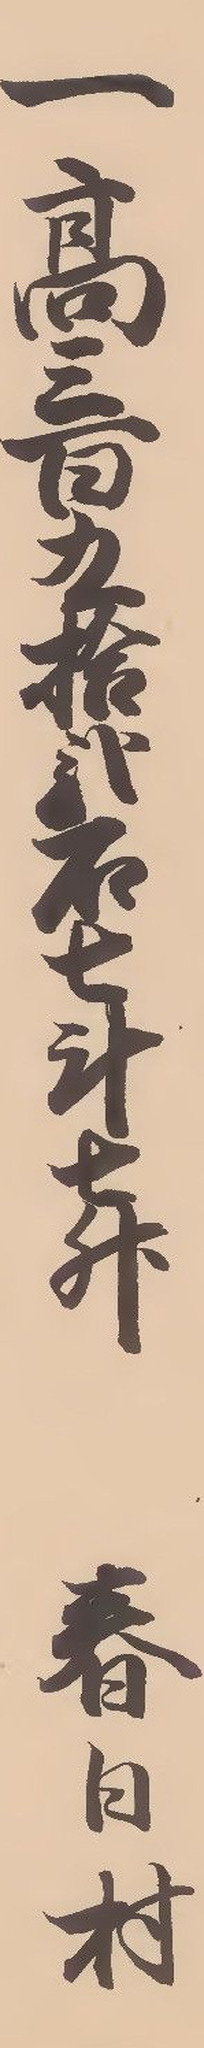一高三百九拾弐石七斗七升春日村
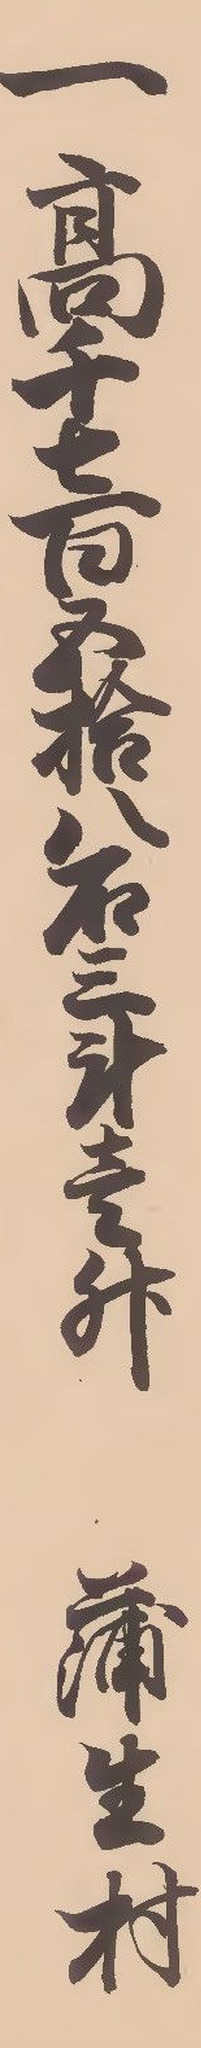一高千七百五拾八石三斗壱升蒲生村
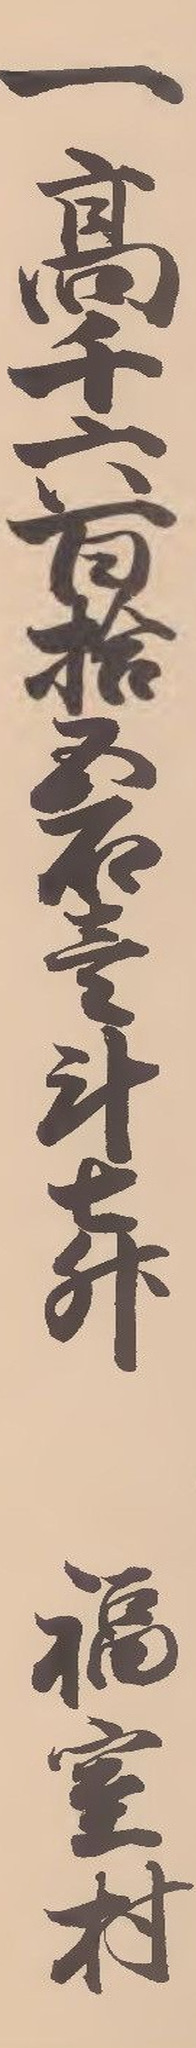一高千六百拾五石壱斗七升福室村
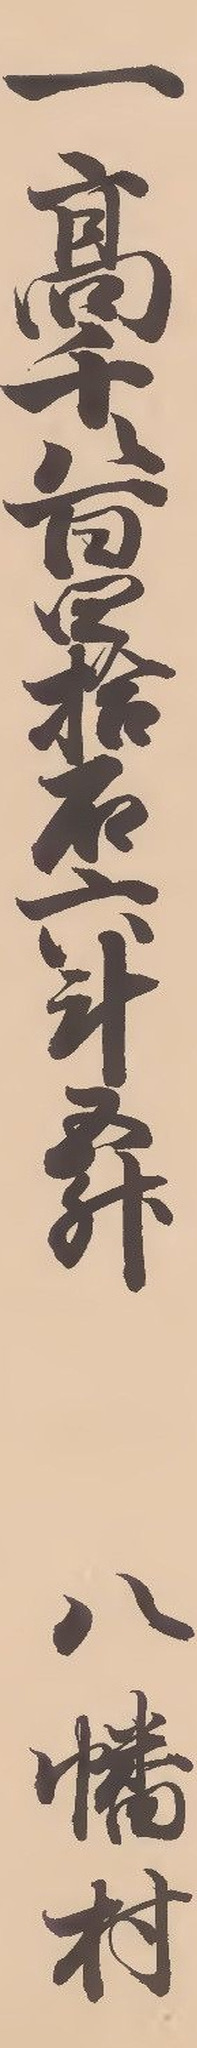一高千八百四拾石六斗五升八幡村
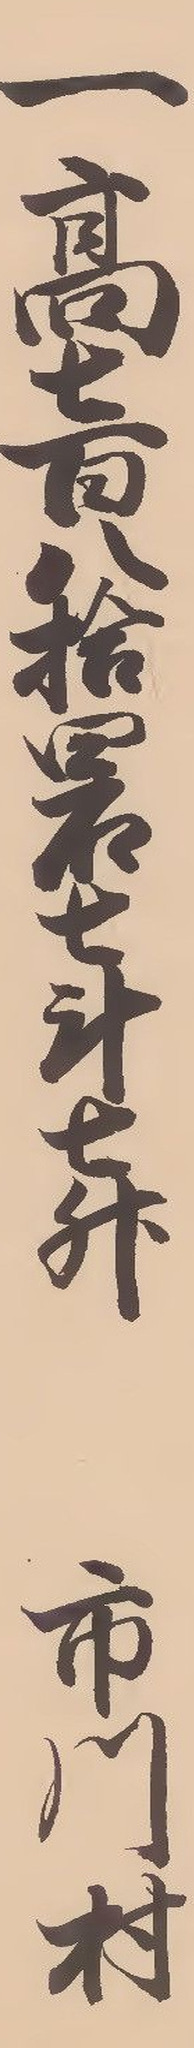一高七百八拾四石七斗七升市川村

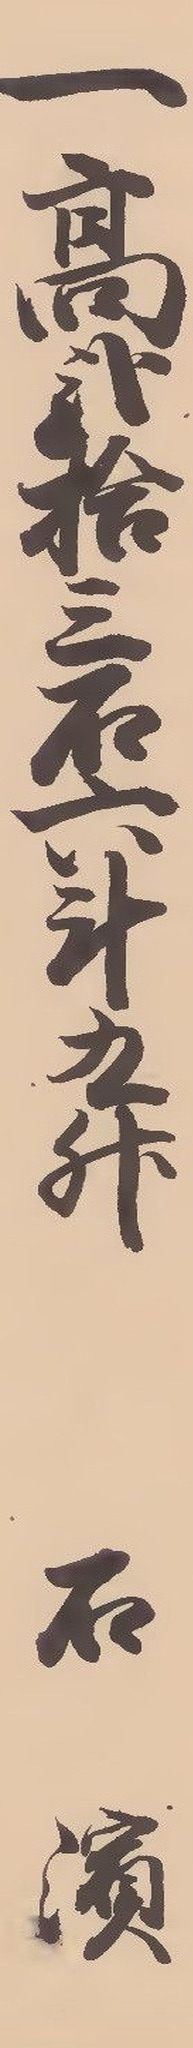一高弐拾三石六斗九升石浜
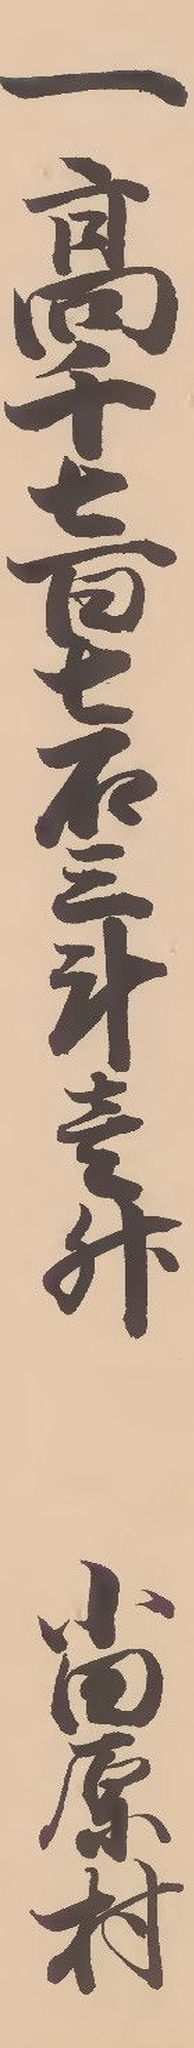一高千七百七石三斗壱升小田原村
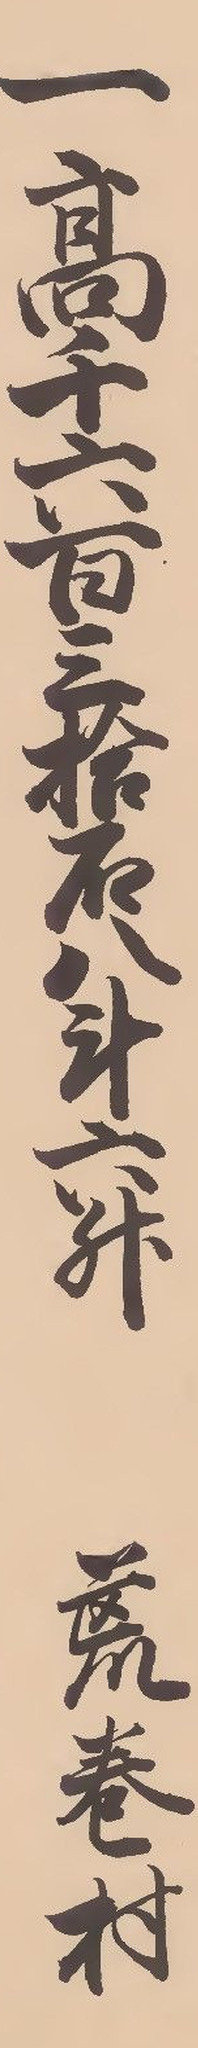一高千六百三拾石八斗六升荒巻村
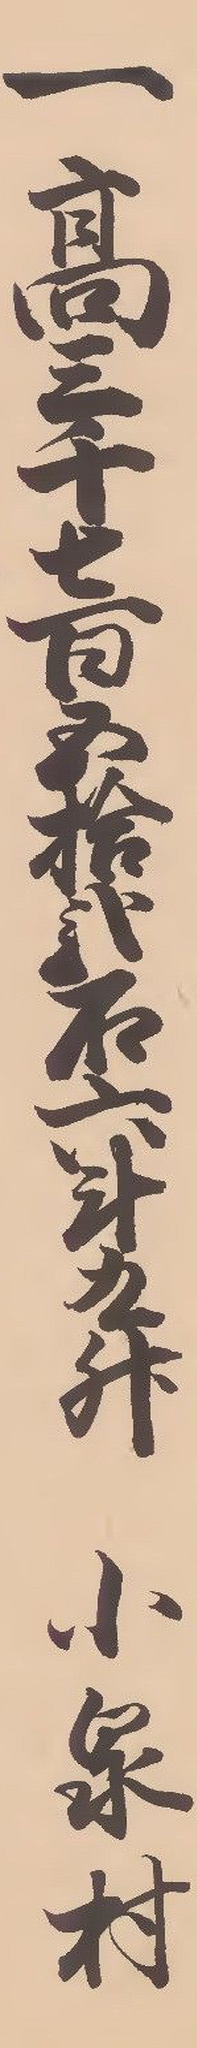一高三千七百五拾弐石六斗九升小泉村
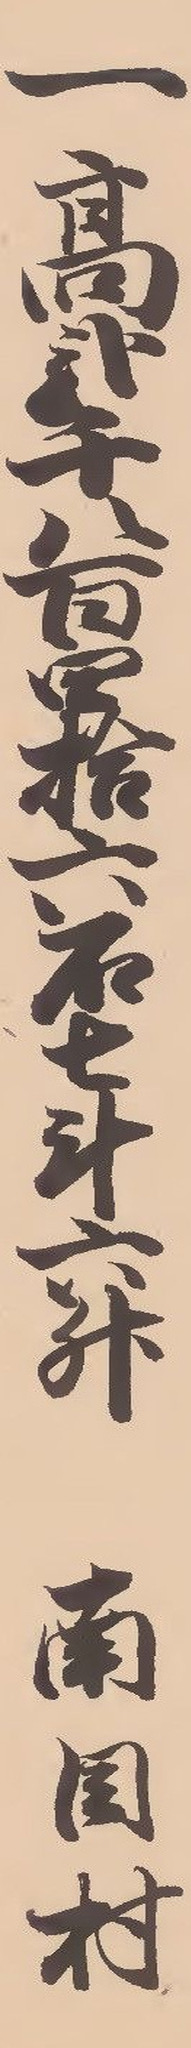一高弐千八百四拾六石七斗六升南目村
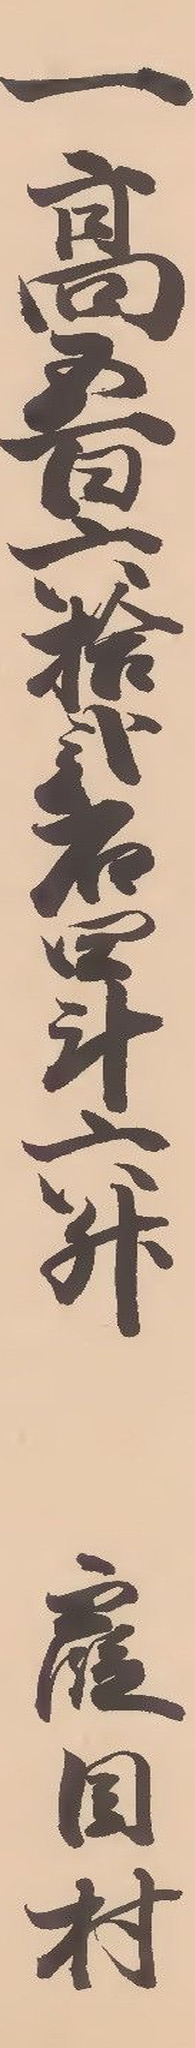一高五百六拾弐石四斗六升霞目村
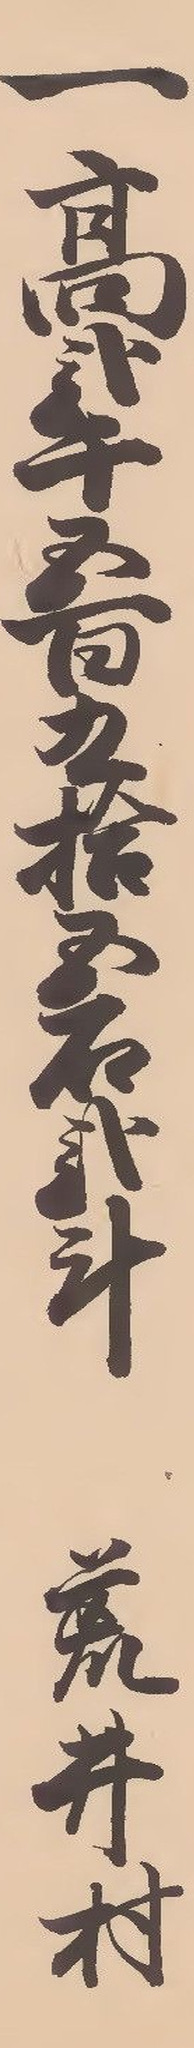一高弐千五百九拾五石弐斗荒井村
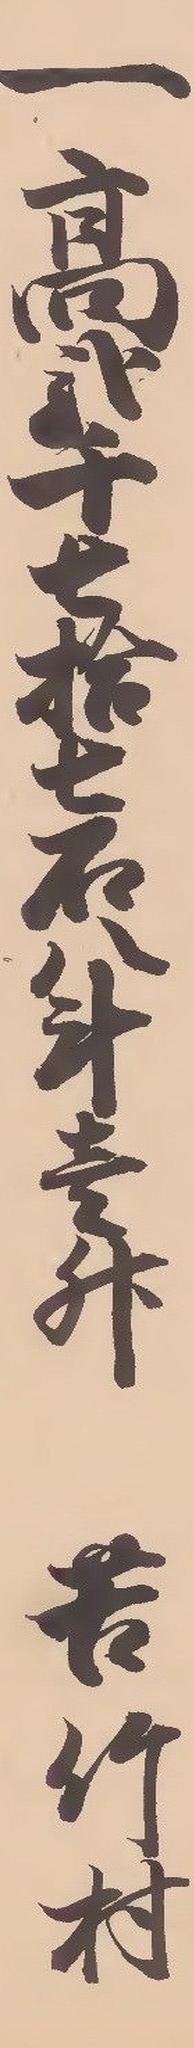一高弐千七拾七石八斗壱升苦竹村

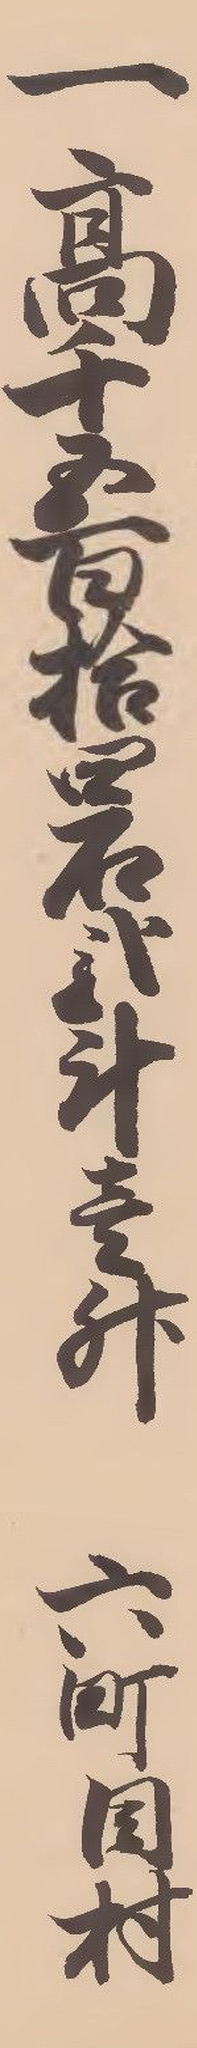一高千五百拾四石弐斗壱升六町目村
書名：陸奥国郷帳　５
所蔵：国立公文書館 National Archives of Japan
